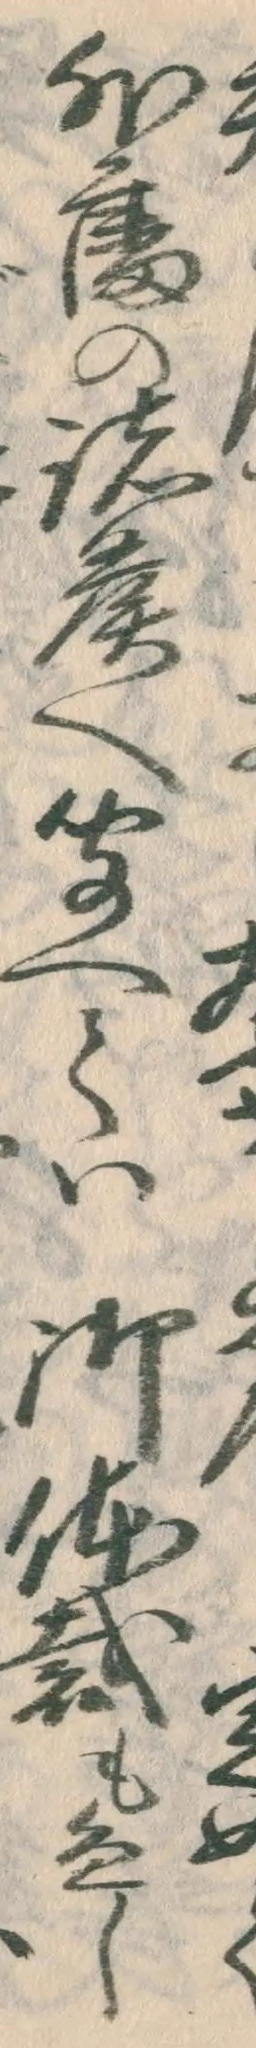外藩の諸侯へ聞へてハ御体裁も宜し
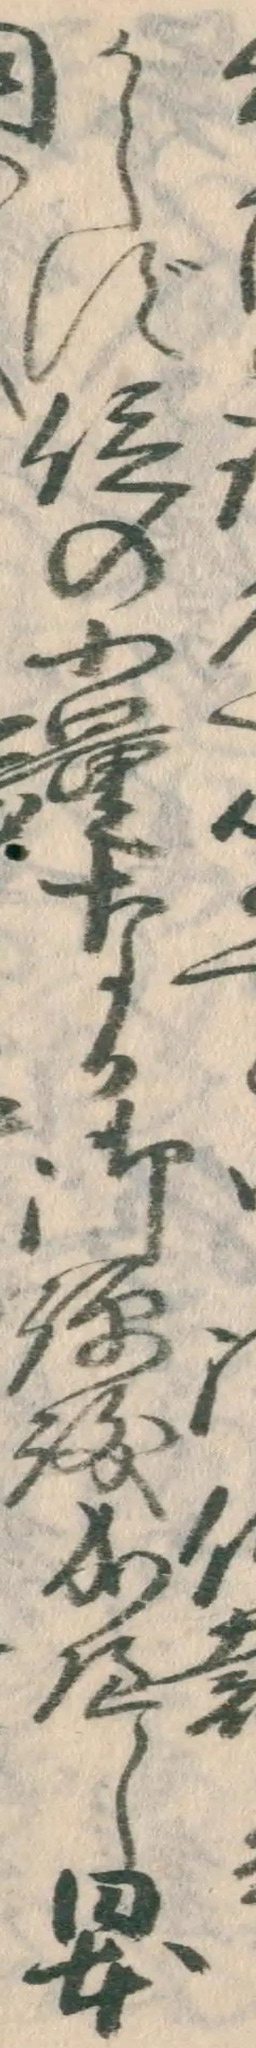からず位の小量なる御評議成へし日本
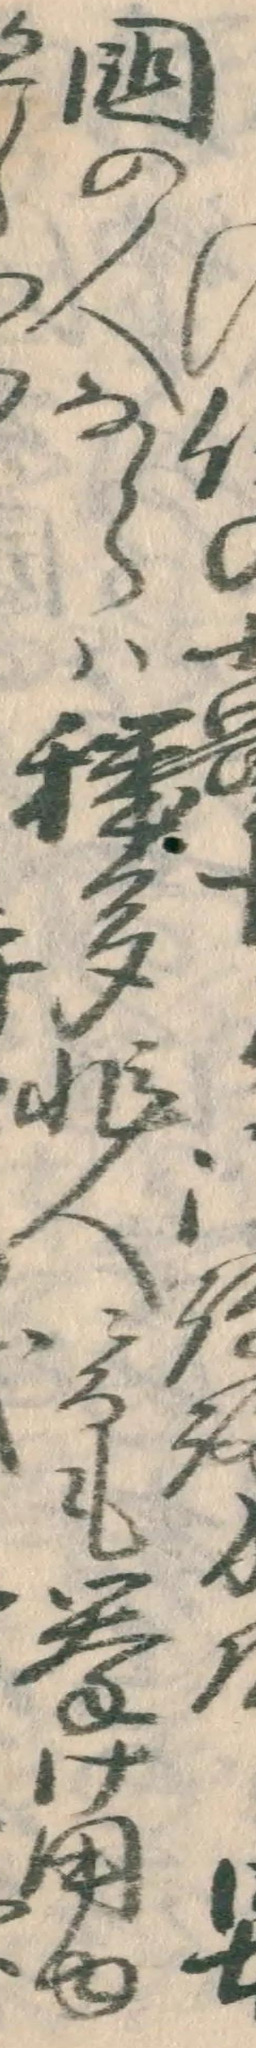国の人ならハ穢多非人ニ而も挙け用ゆ
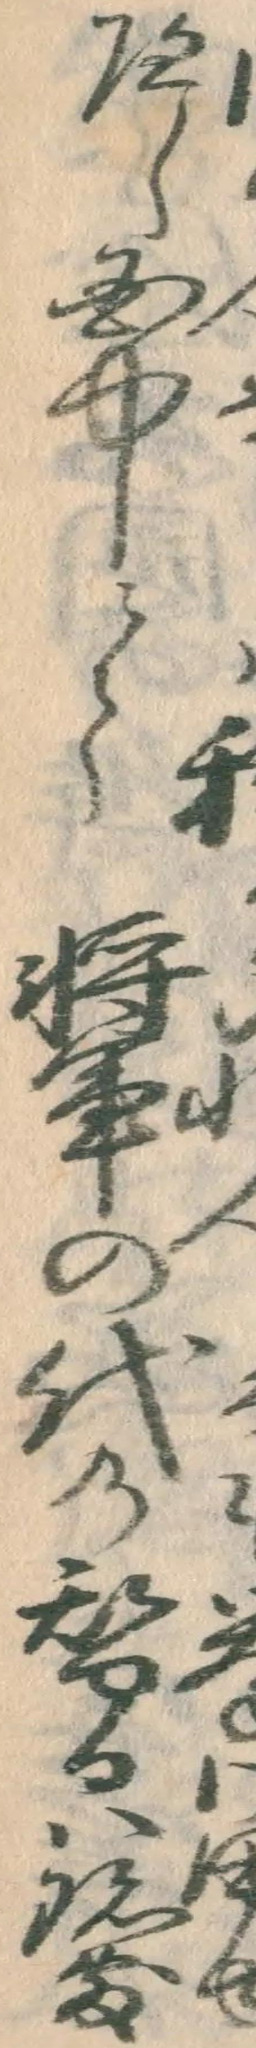へし国中ニて将軍の代の替るハ珎敷

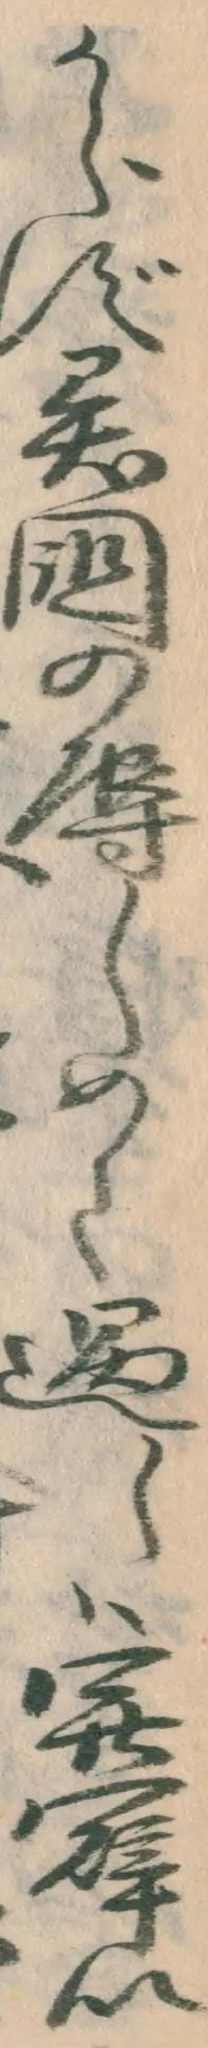からず異国の辱しめに遇しハ開闢以
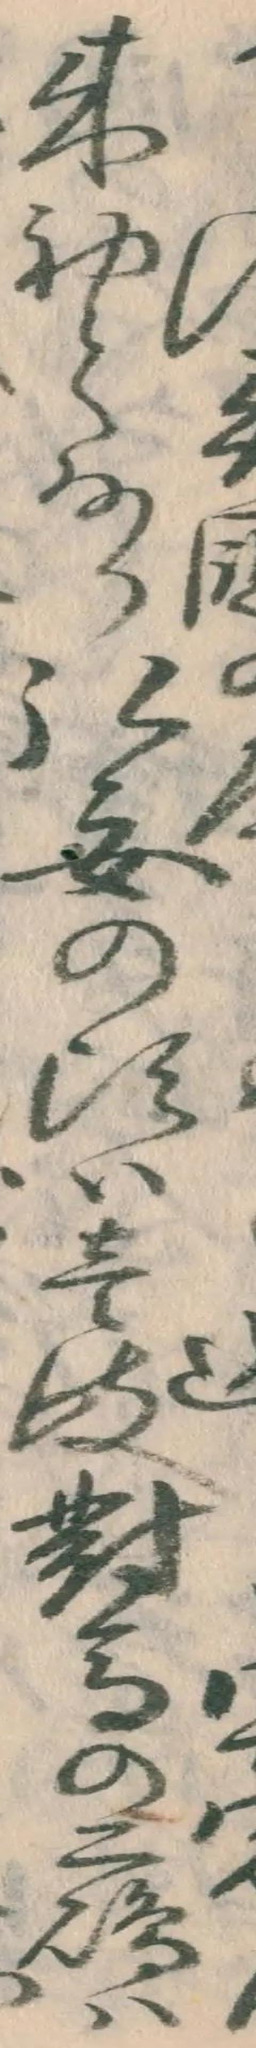来初てなり弘安の頃ハ壱岐對馬の二嶋ハ
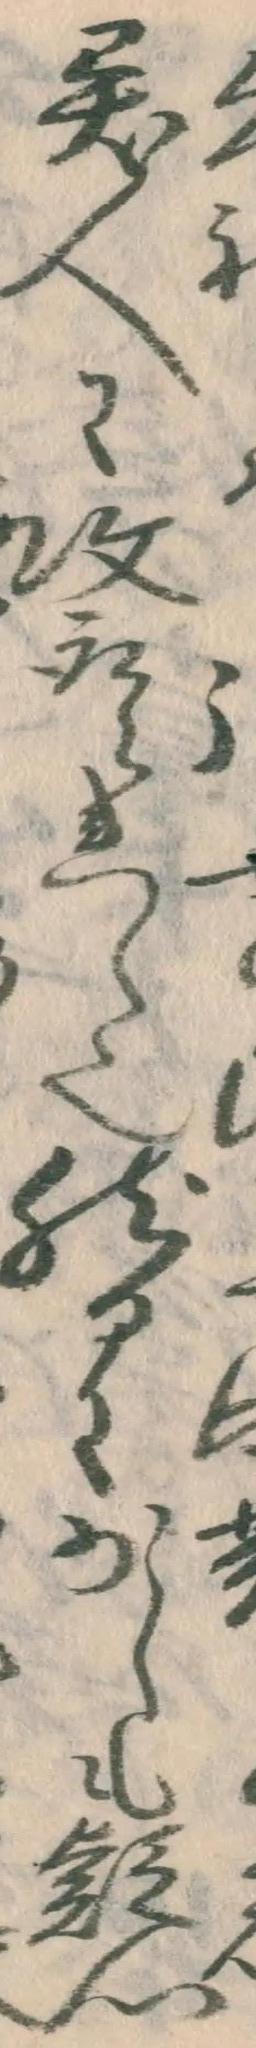異人に攻取られし也然るに少しも疑心
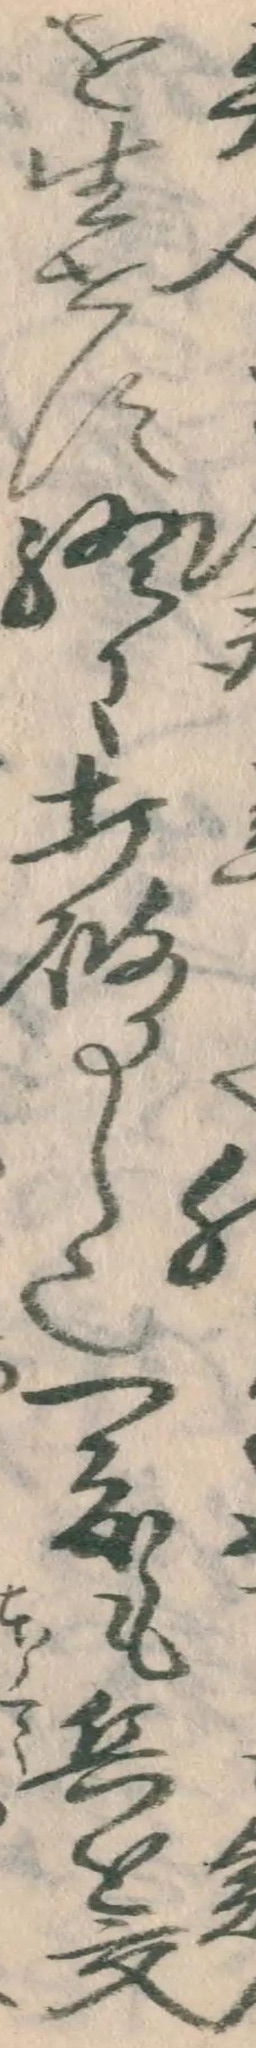を生せす終に打破りし也一度も兵を交
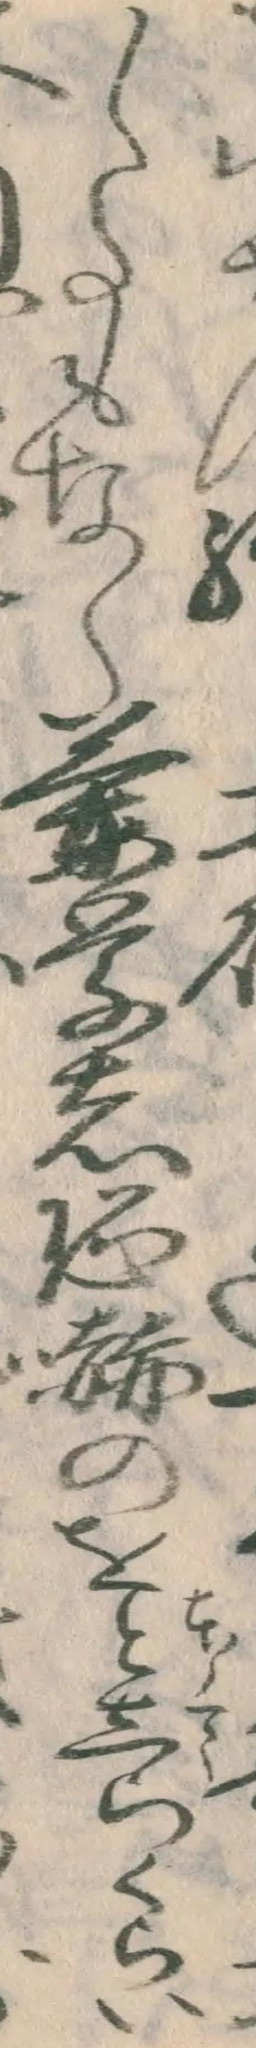し事もなし蘭学者恐赫のをとしらくらい
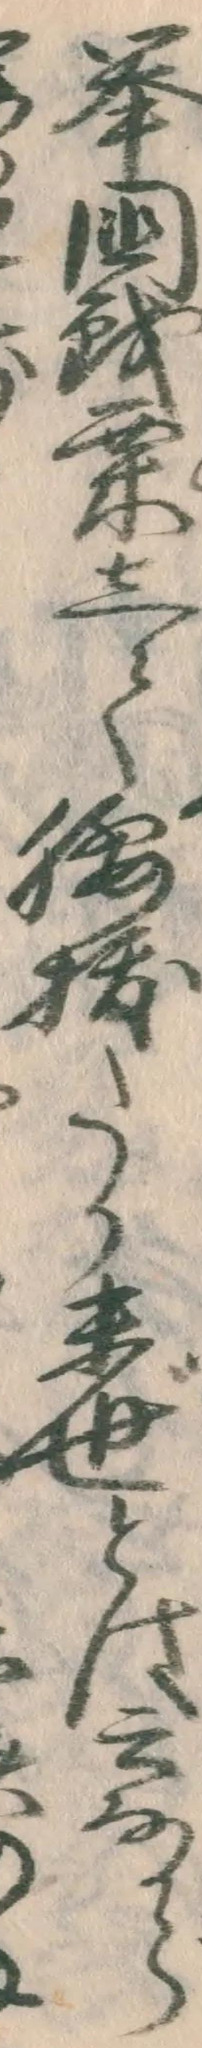挙国戦栗して腰抜たり末世とは云なから
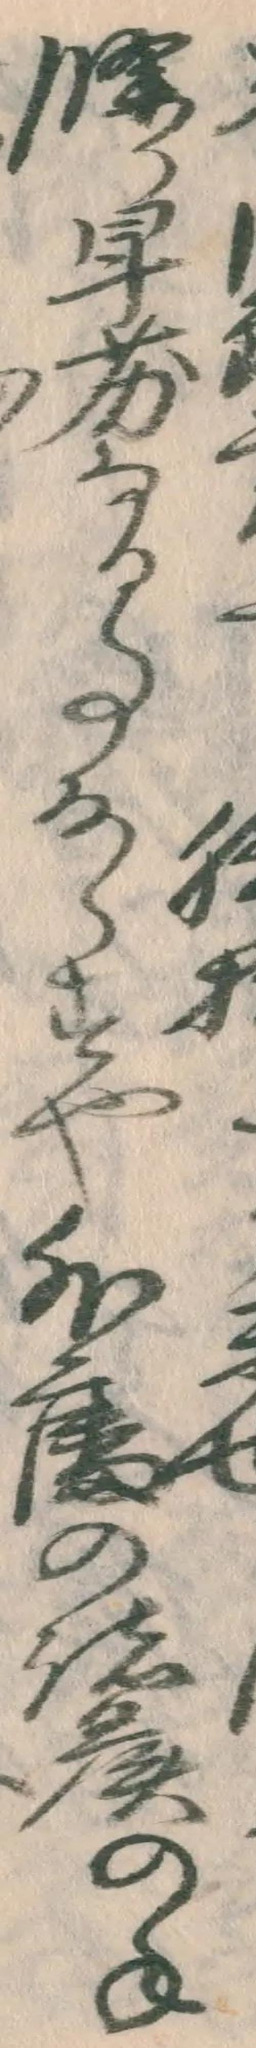餘り卑劣なる事ならすや外藩の諸侯の手
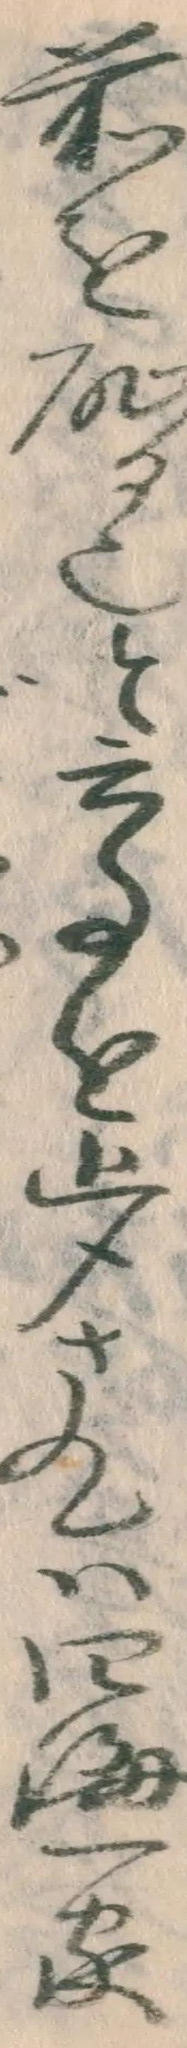前を恥る也と云事を止メされハ四海一家
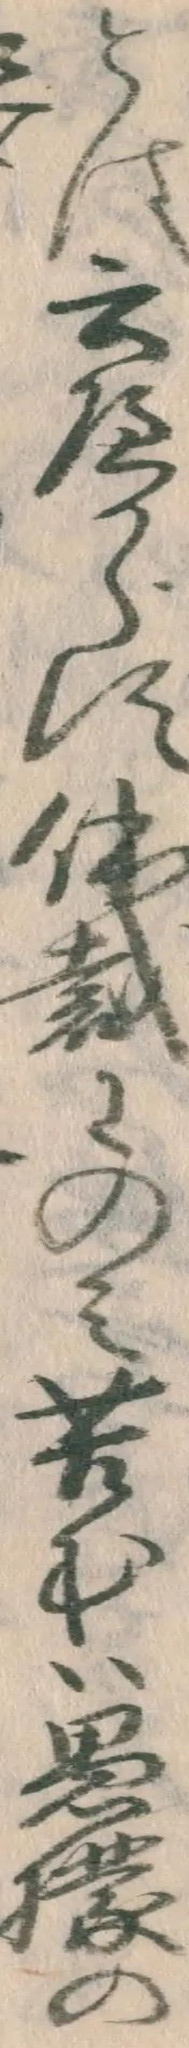とは云へからず体裁にのミ苦むハ愚朦の
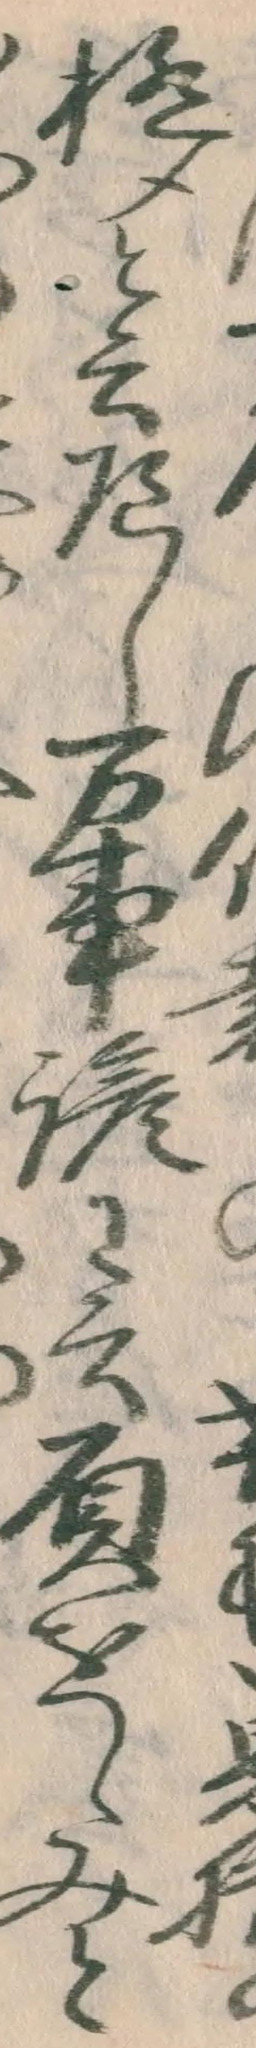極メと云へし万事諺に云負をしみに
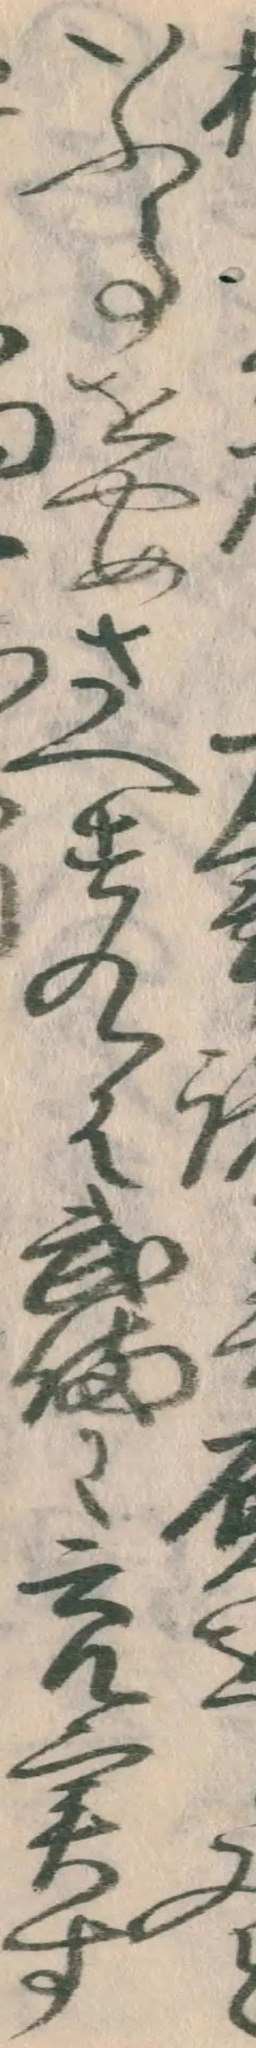いふ事をやめさへすれは武備に充実す
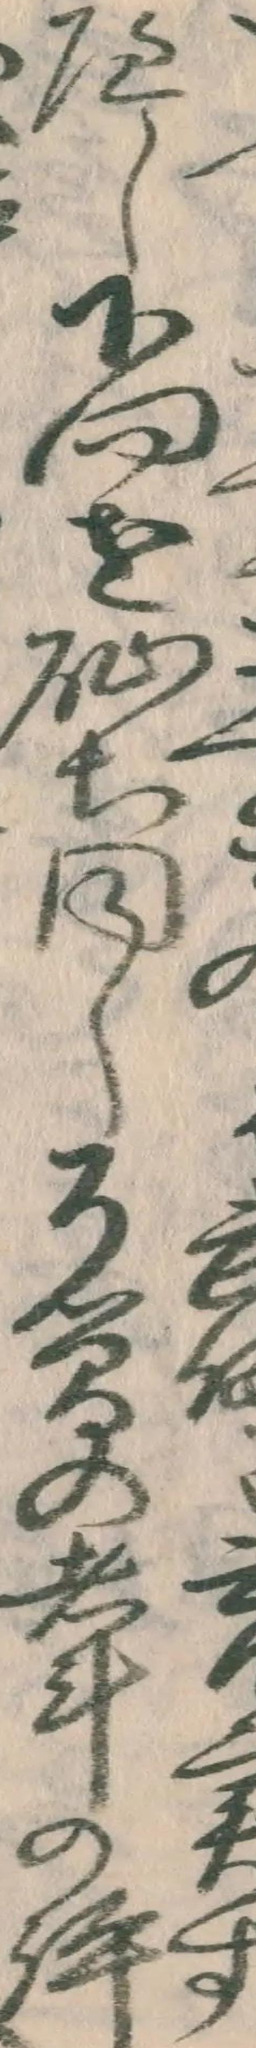へし下向を恥ち同し了簡の者斗の評
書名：麗斎叢書. 20
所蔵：国立国会図書館 National Diet Library, JAPAN
